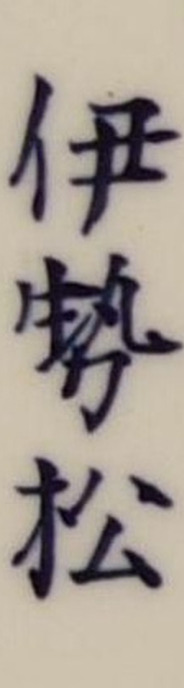伊勢松
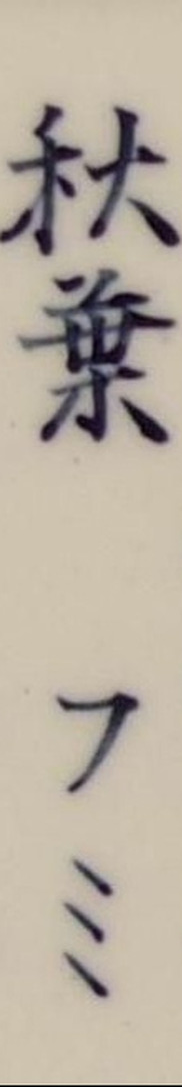秋葉フミ
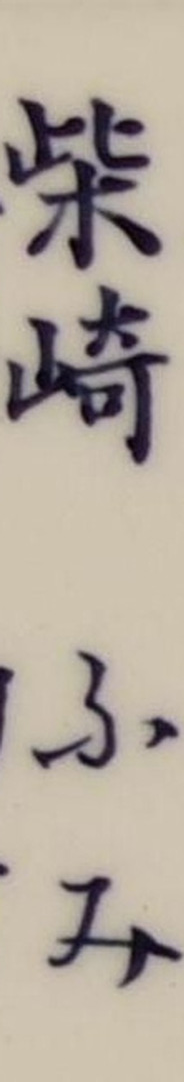紫崎ふみ
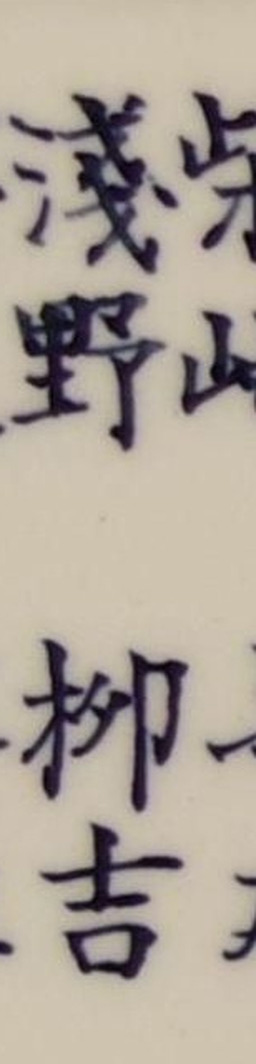浅野柳吉
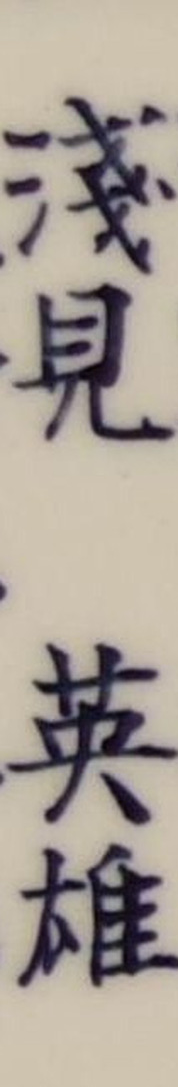浅見英雄
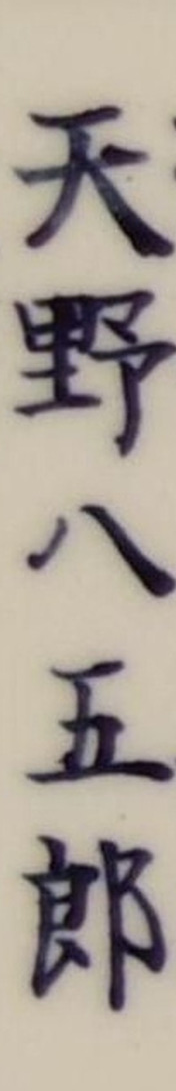天野八五郎

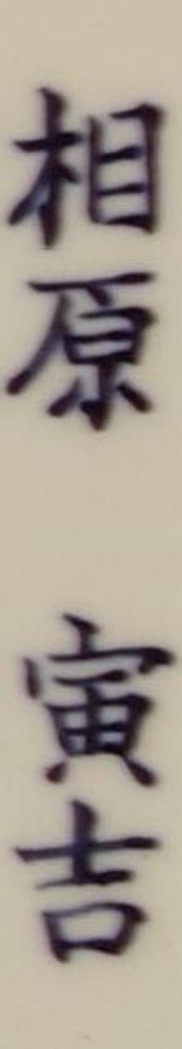相原寅吉
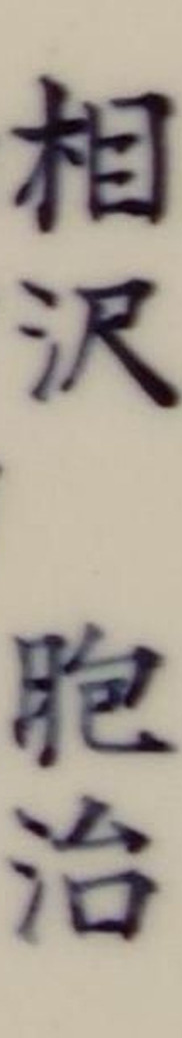相沢肥治
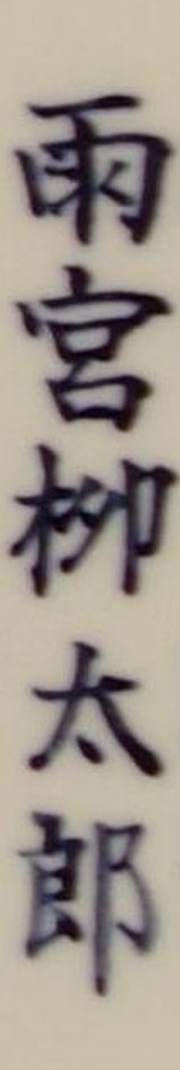雨宮柳太郎
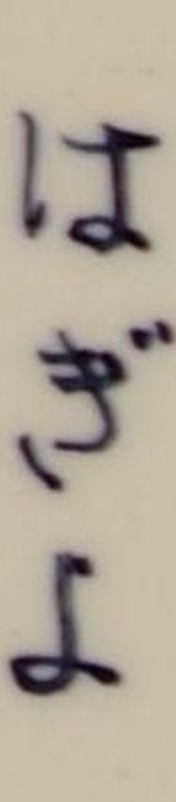はぎよ
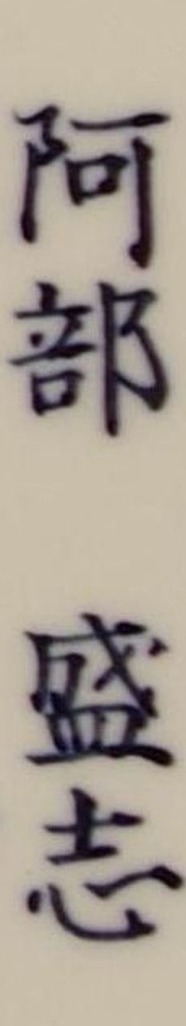阿部盛志
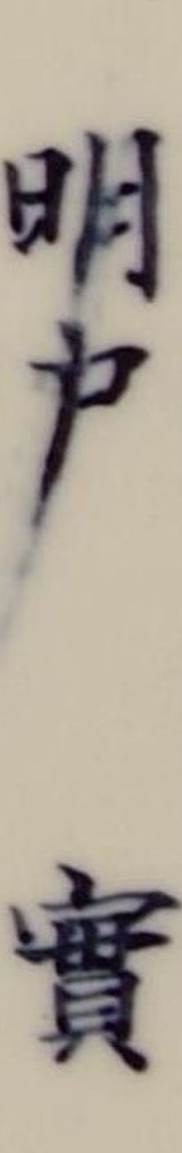明戸實
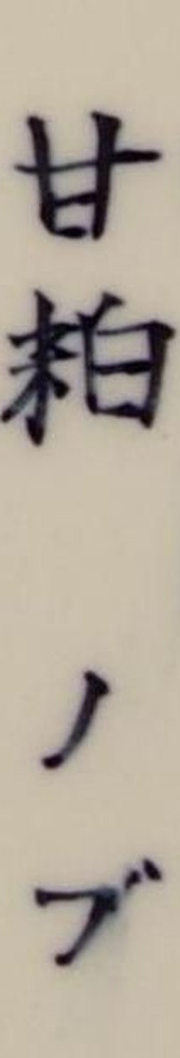甘粕ノブ
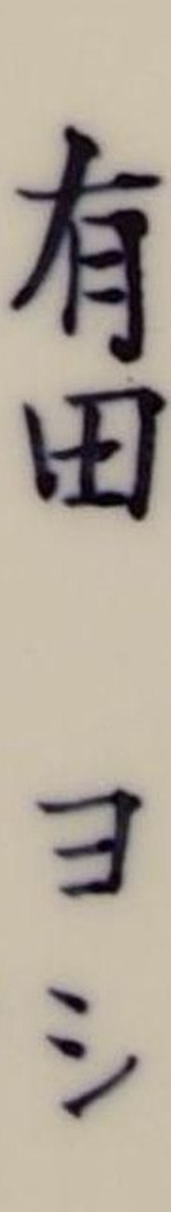有田ヨシ
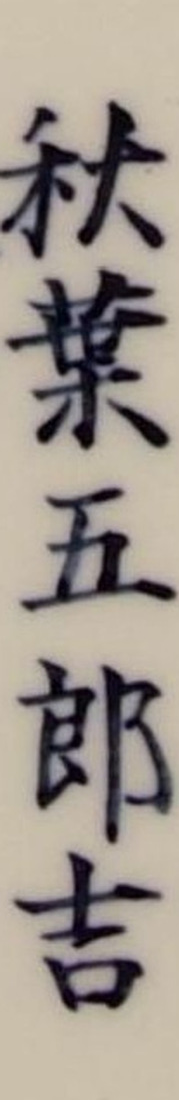秋葉五郎吉
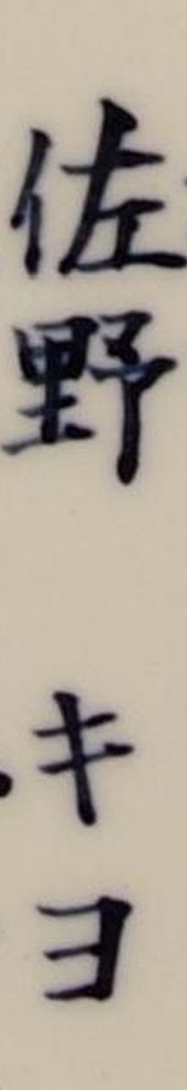佐野キヨ
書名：M~S
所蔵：高野山金剛峯寺
